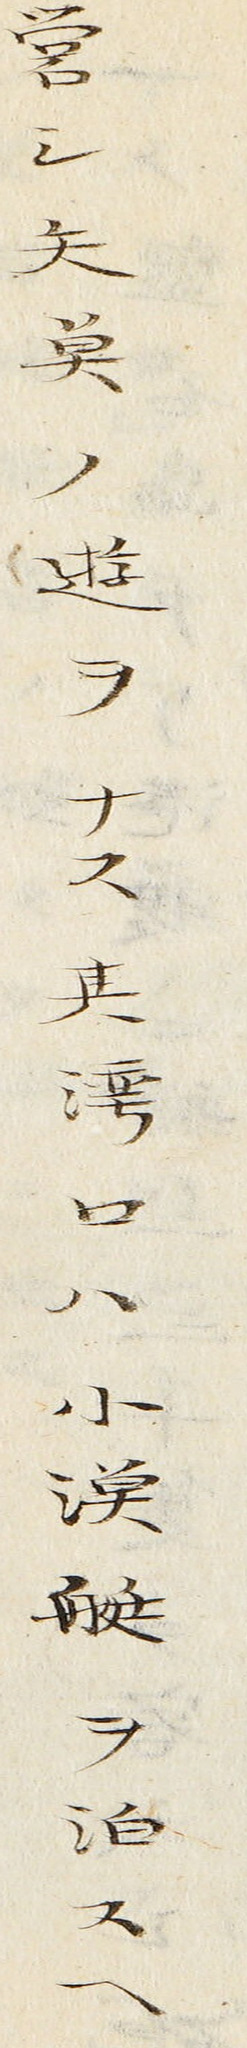営シ矢莫ノ遊ヲナス其湾口ハ小艇ヲ泊スヘ
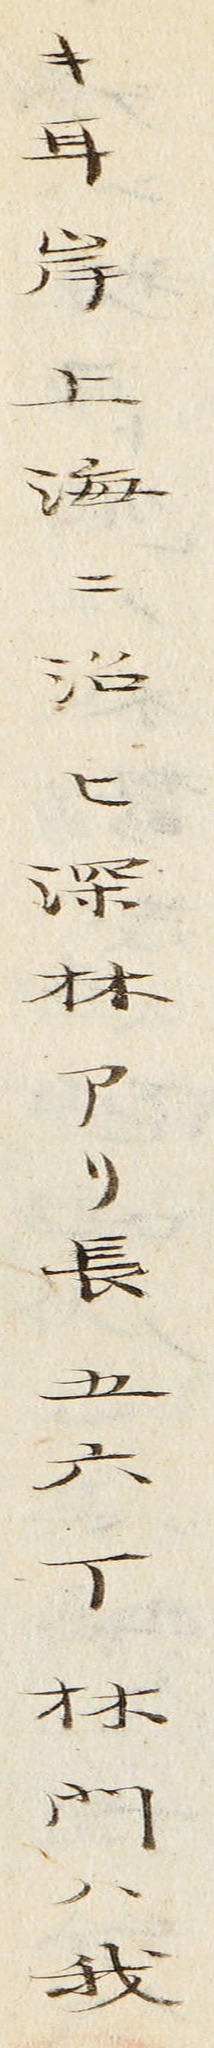キ耳岸上海ニ沿ヒ深林アリ長五六丁林門ハ我
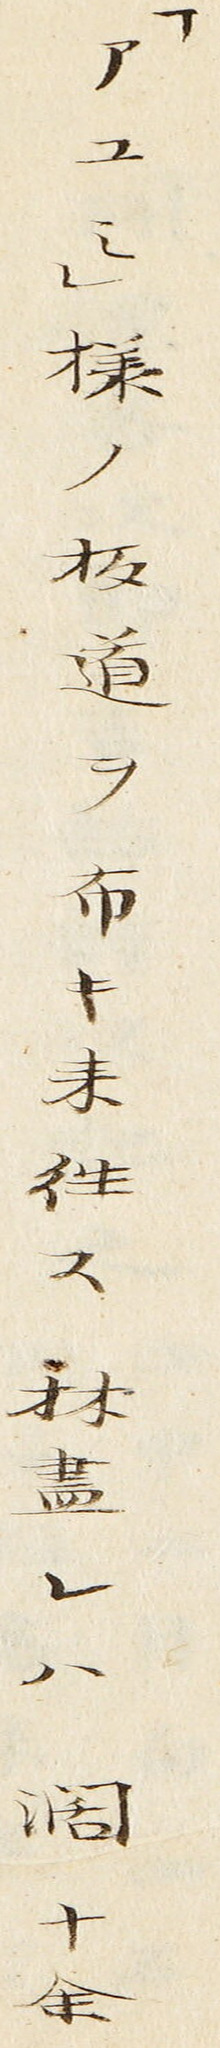「アユミ」様ノ板道ヲ布キ来往ス林尽レハ濶十余
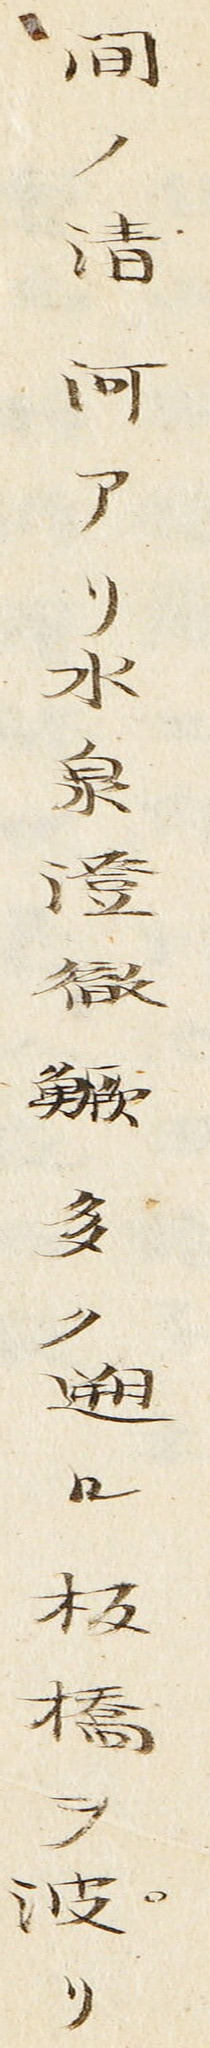間ノ清河アリ水泉澄徹鱖多ク遡ル板橋ヲ波ヲ
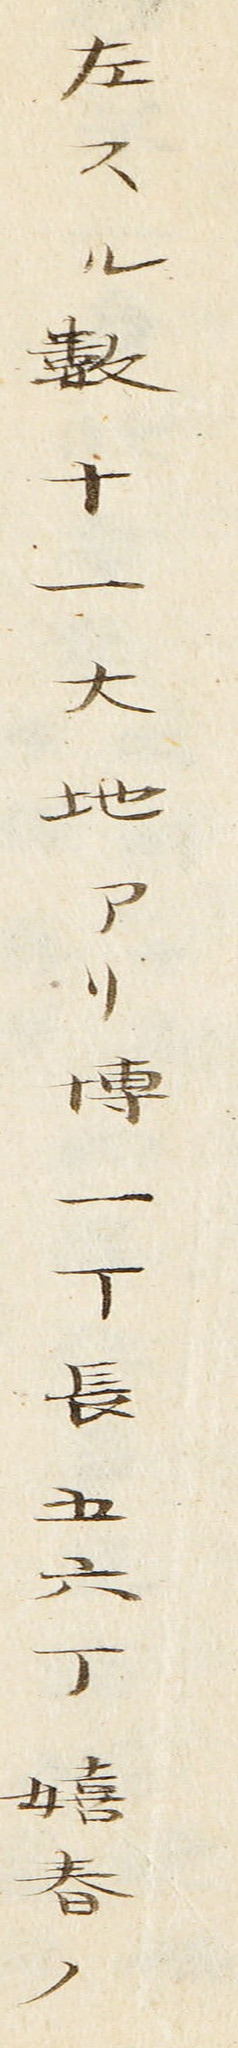左スル数十一大地アリ博一丁長五六丁嬉春ノ
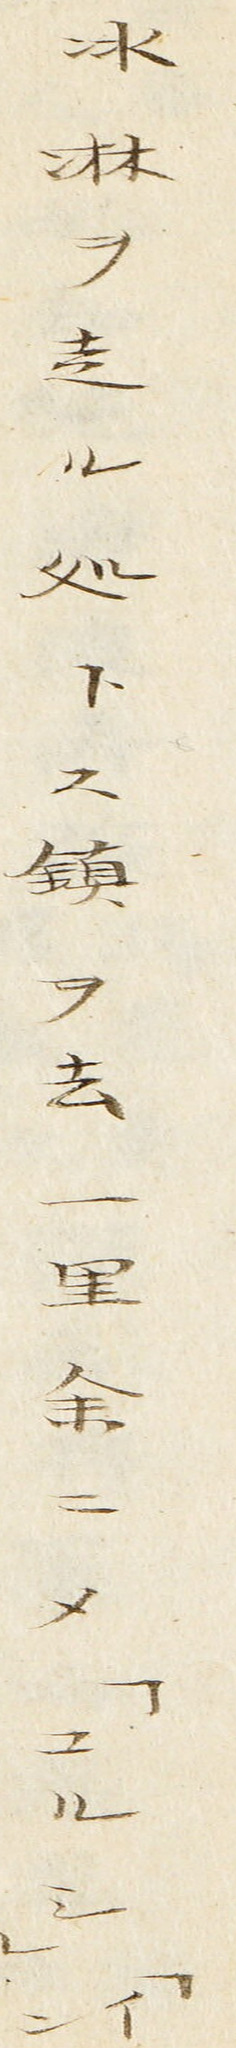冰ヲ走ル処下ス鎮ヲ去一里余ニシテ「ユルシ」「イン
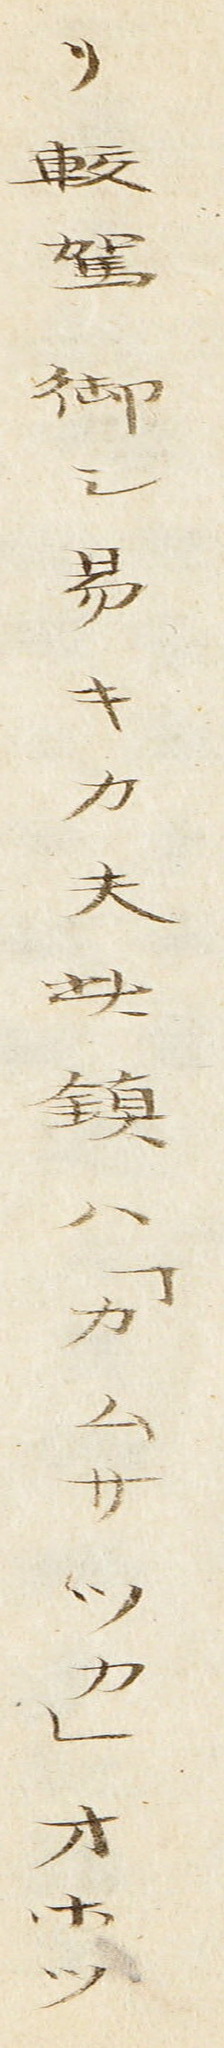リ較駕御シ易キカ夫此鎮ハ「カムサツカ」オホツ
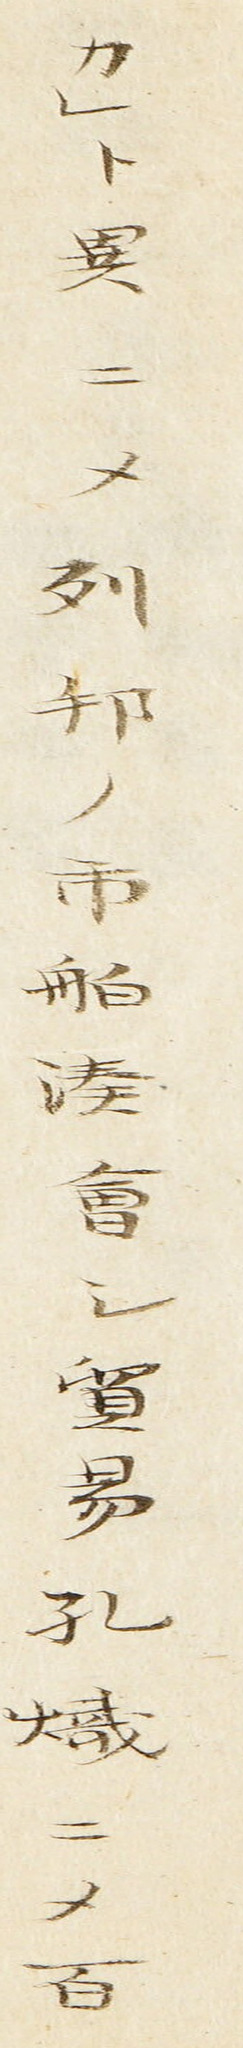カ」ト異ニシテ列邦ノ市舶湊会シ貿易孔熾ニシテ百
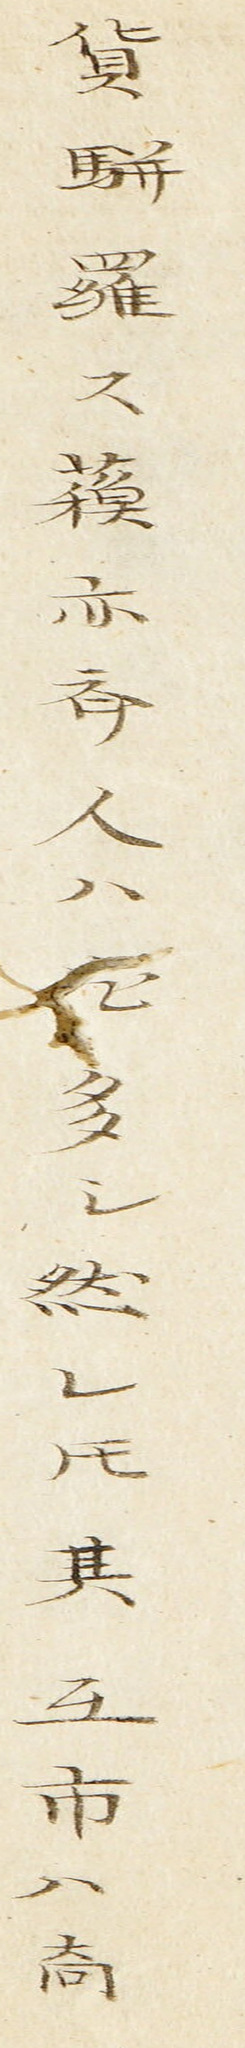貨駢羅ス蘓亦斉人ハ尤多シ然レトモ其互市ハ商
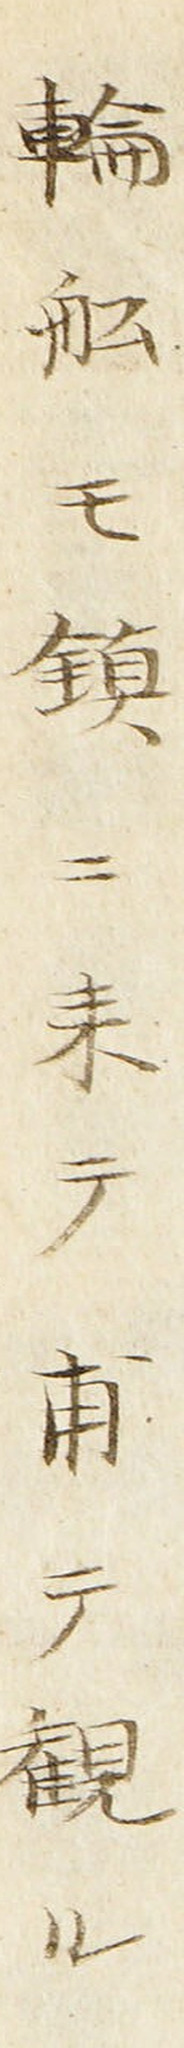輪船モ鎮ニ来テ甫テ観ル

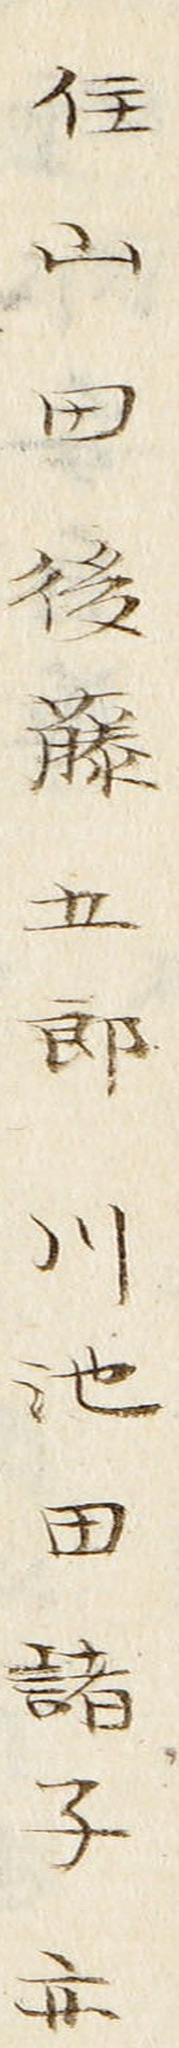住山田後藤立郎川池田諸子立
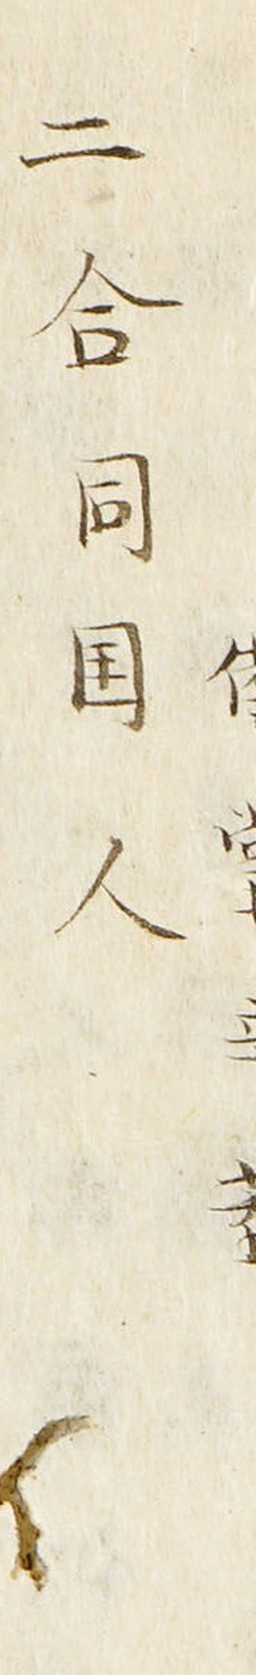二合同国人
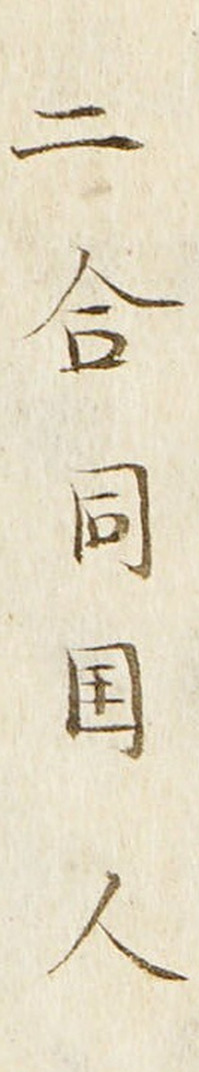二合同国人

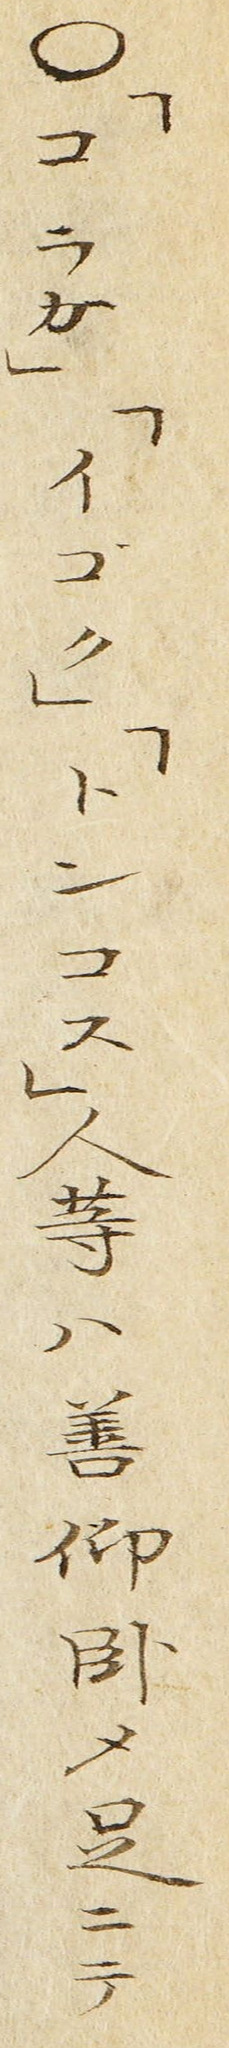〇「コラガ」「イゴク」「トンコス」人等ハ善仰臥メロ之ニテ
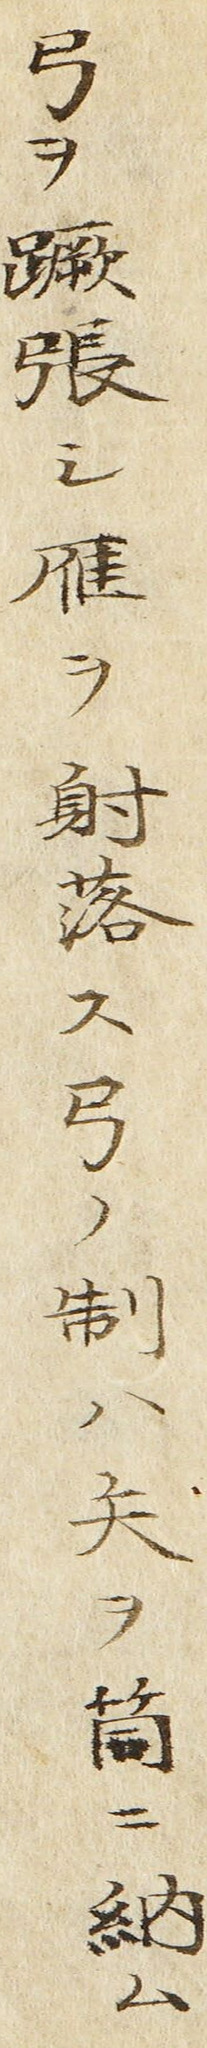弓ヲ張之雁ヲ射落ス弓ノ制ハ矢ヲ筒ニ納ム
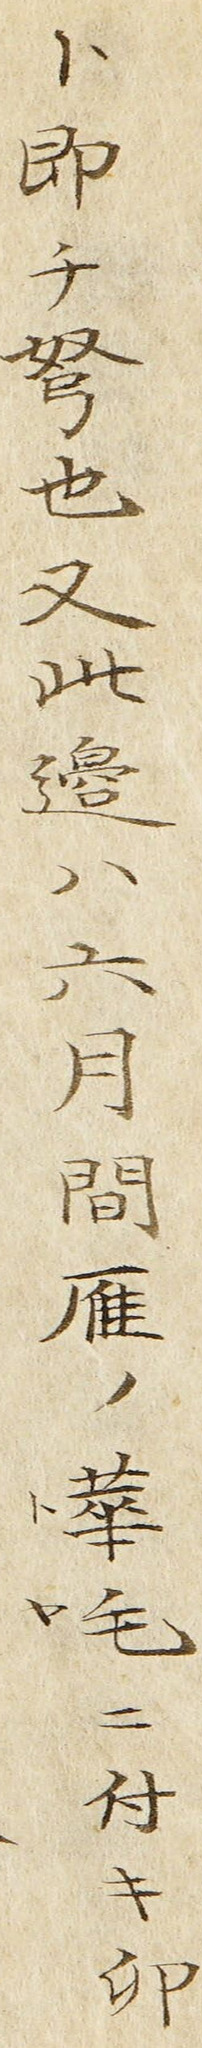ト即チ弩也又此邉ハ六月間雁ノ華毛ニ付キ卯
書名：流蕃通書
